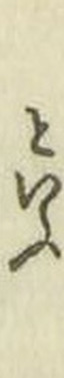といふ
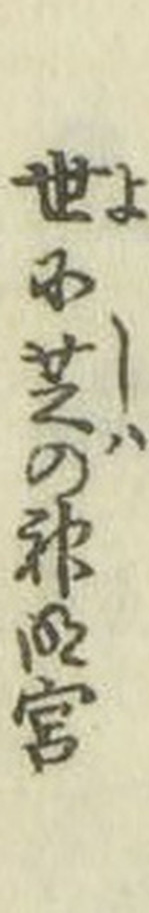世に芝の神明宮

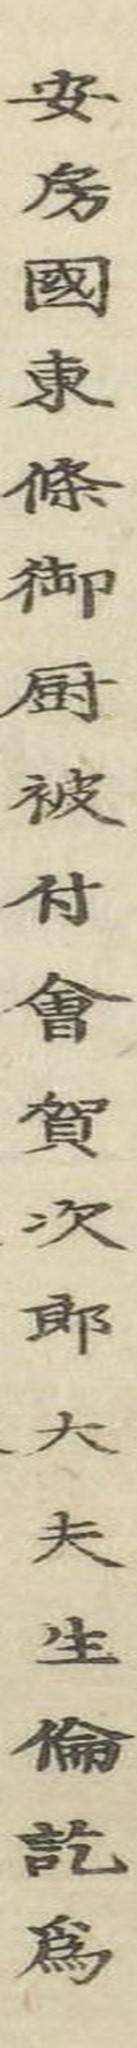安房国東條御厨被付會賀次郎大夫生倫訖為
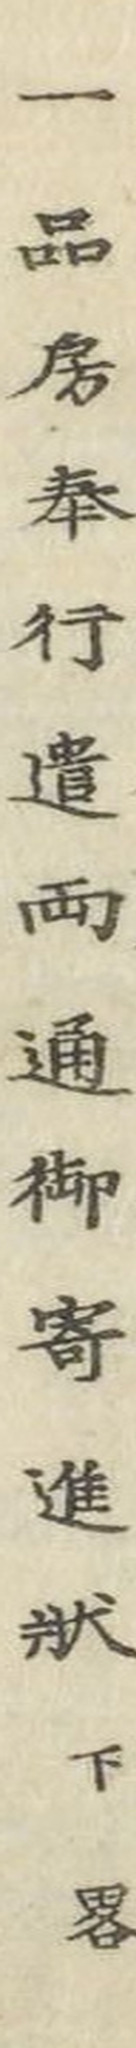一品房奉行遣両通御寄進状下略
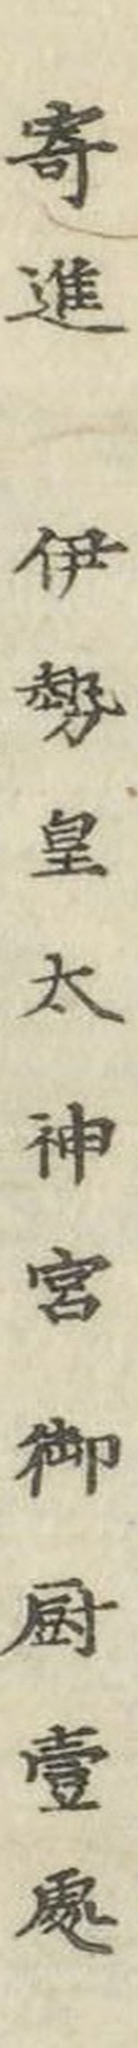寄進伊勢皇太神宮御厨壹処
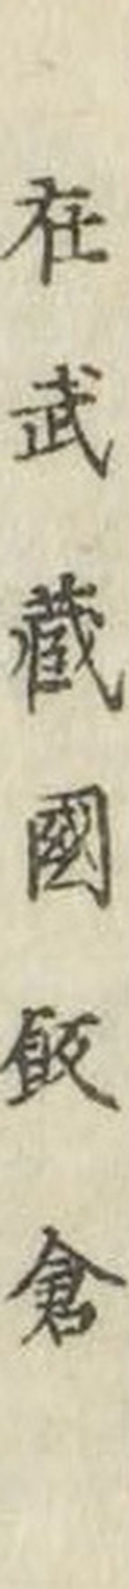在武蔵國飯倉
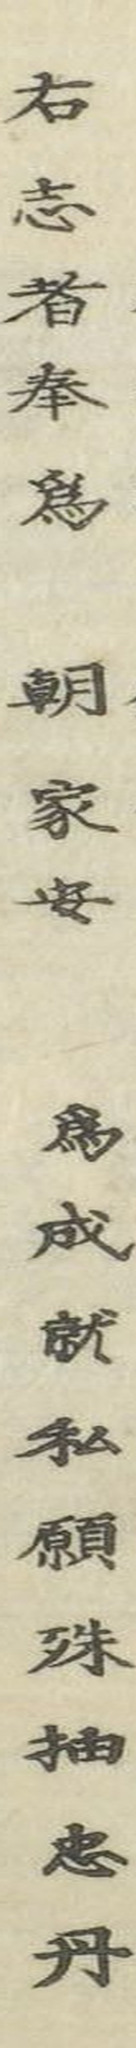右志者奉為朝家安為成就私願殊抽忠丹
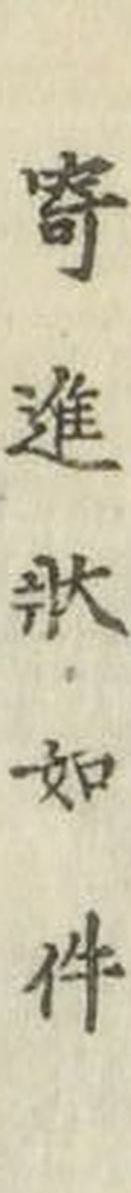寄進状如件
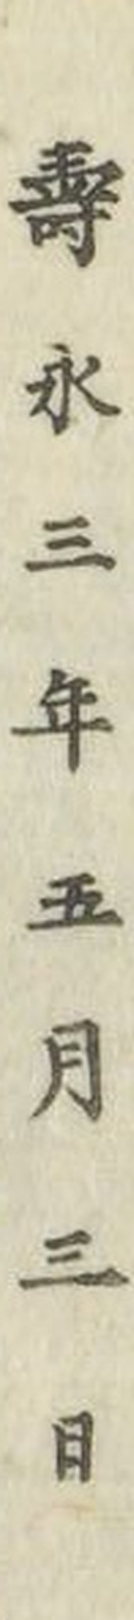寿永三年五月三日
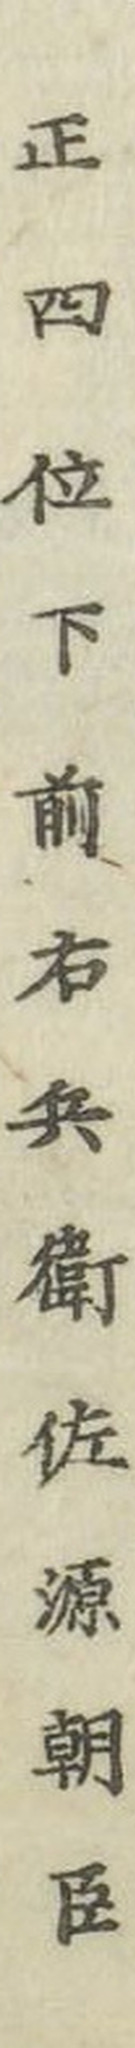正四位下前右兵衛佐源朝臣
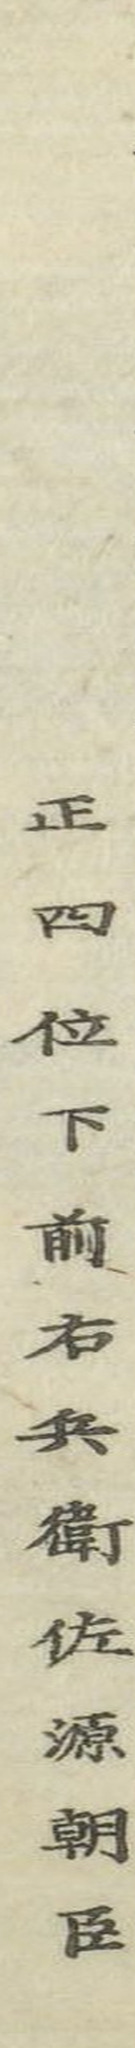正四位下前右兵衛佐源朝臣
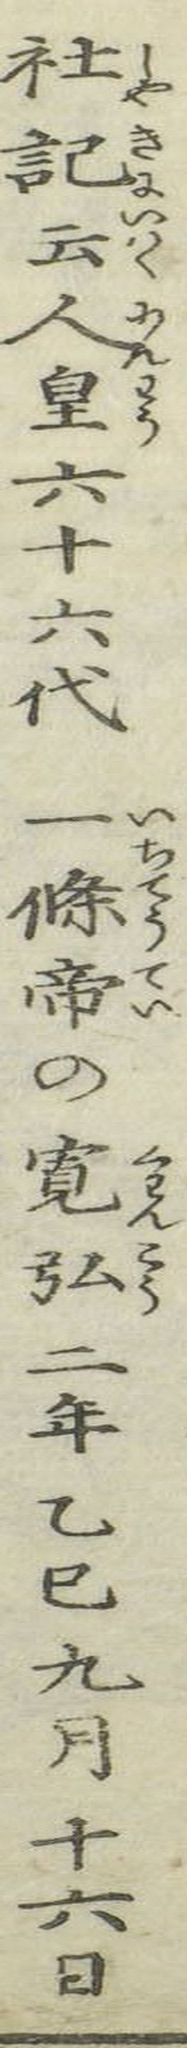社記云人皇六十六代一條帝の寛弘二年乙巳九月十六日
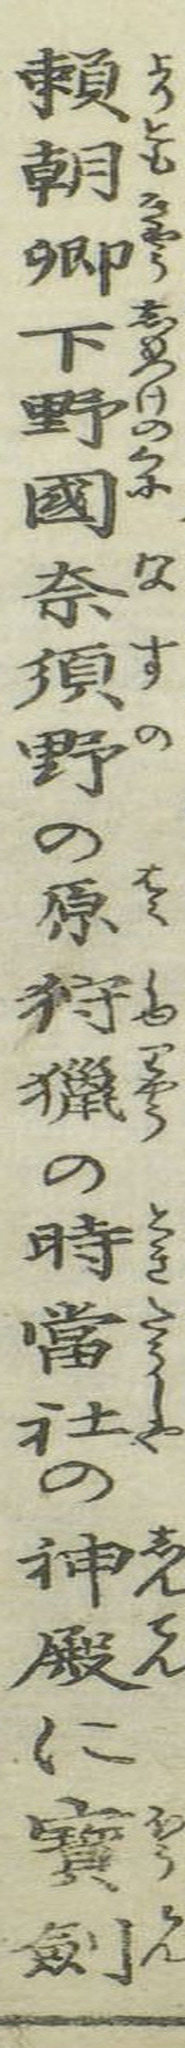頼朝卿下野國奈須野の原狩猟の時當社の神殿に宝剣

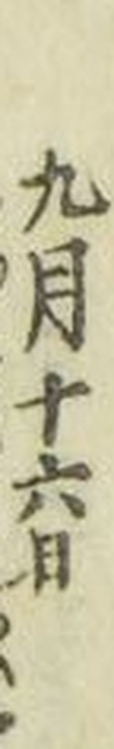九月十六日
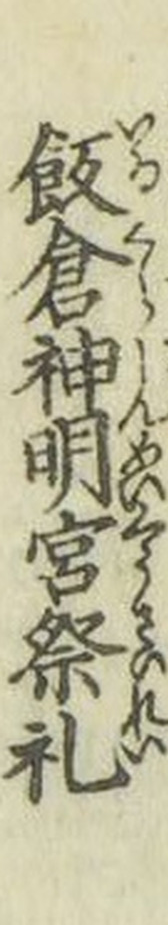飯倉神明宮祭礼
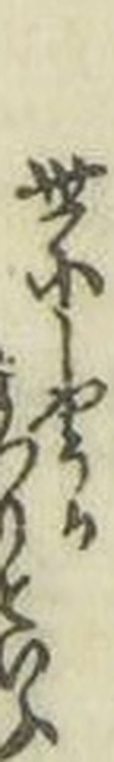世にしやうか
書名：江戸名所図会 20巻 巻之3
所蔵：東京学芸大学教育コンテンツアーカイブ
